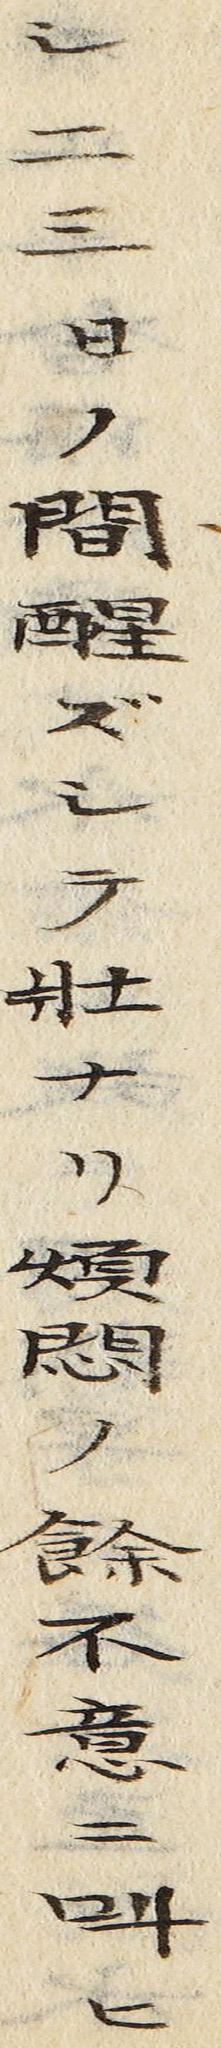シ二三日ノ間醒ズシテ壮ナリ煩悶ノ余不意に叫ヒ
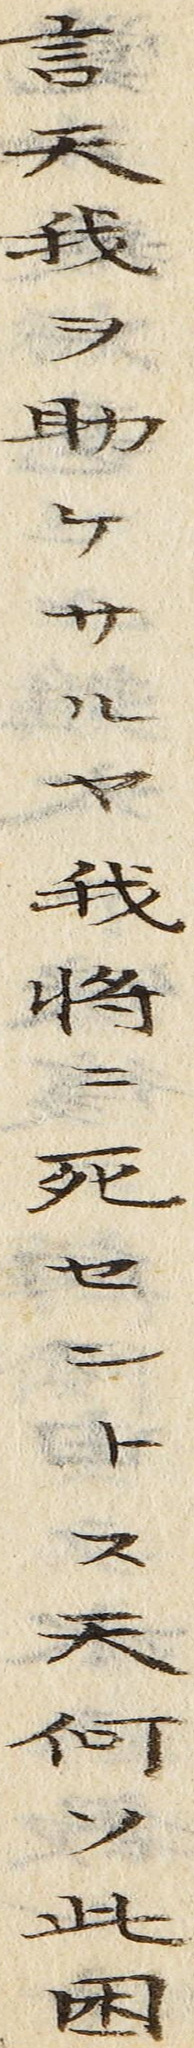言天我ヲ助ケサルヤ我将ニ死セントス天何ソ此困
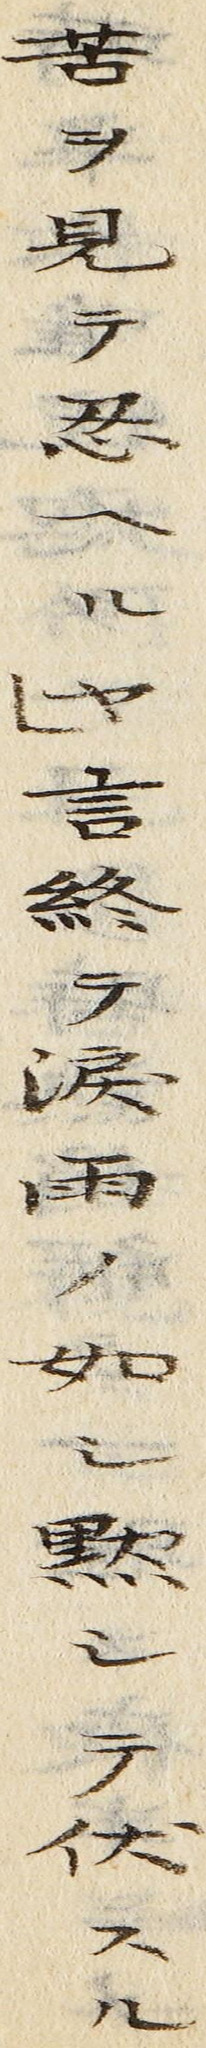苦ヲ見テ忍ヘルヤ」言終テ涙雨ノ如シ黙シテ伏スル
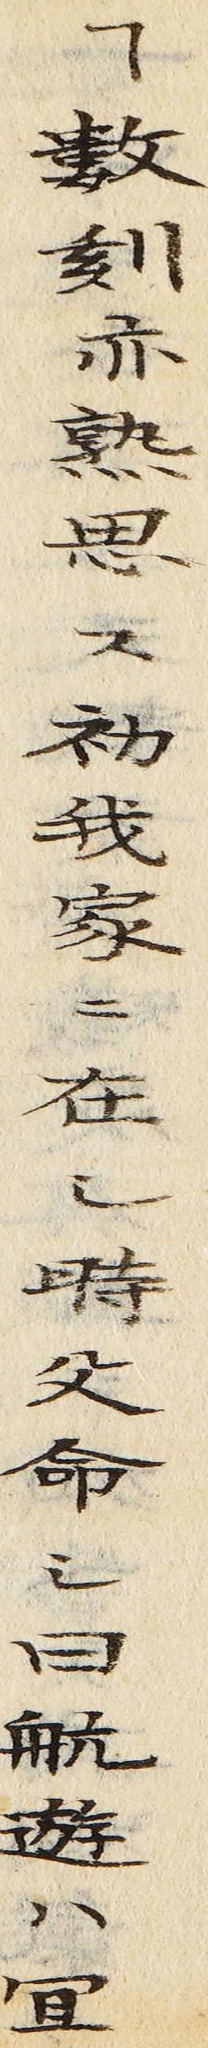コト数刻亦熟思ス初我家ニ在シ時父命シ曰航遊ハ宜
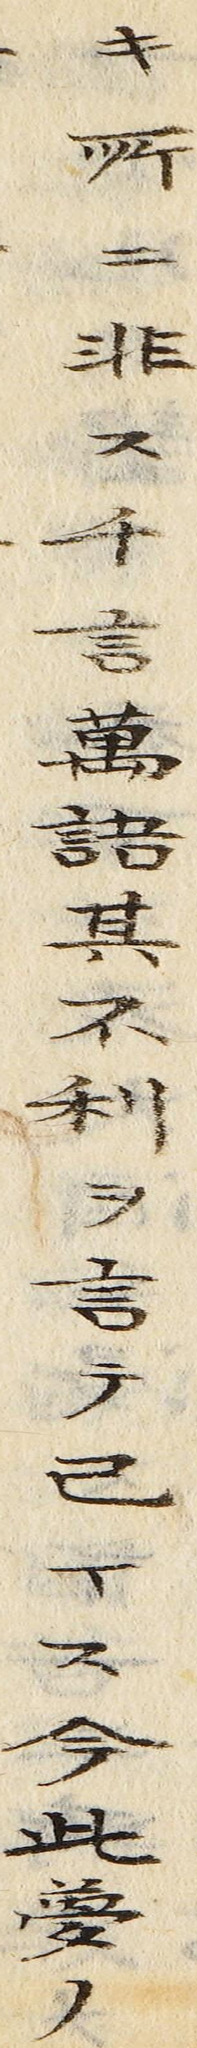キ所ニ非ス千言万語其不利ヲ言テ已マス今此夢ノ
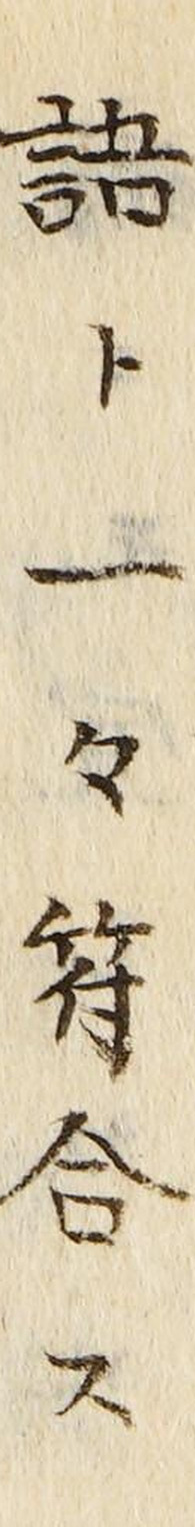語ト一々符合ス
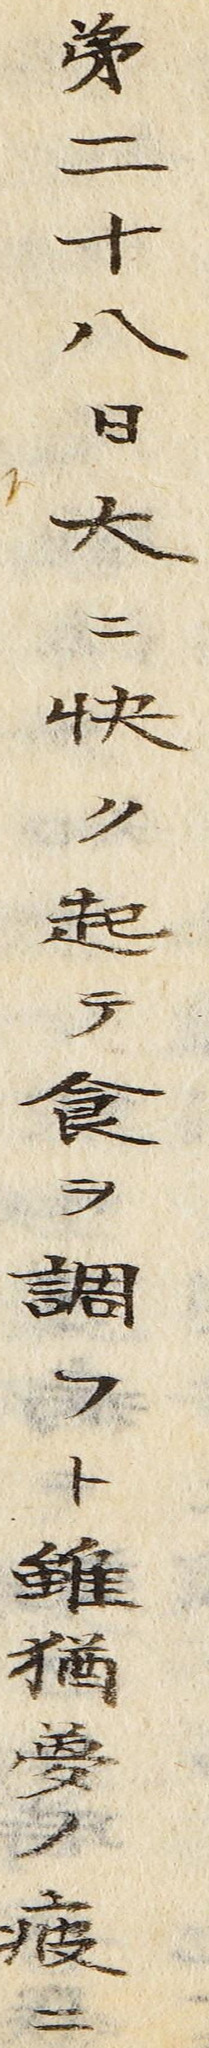第二十八日大ニ快ク起テ食ヲ調フト雖猶夢ノ疲ニ
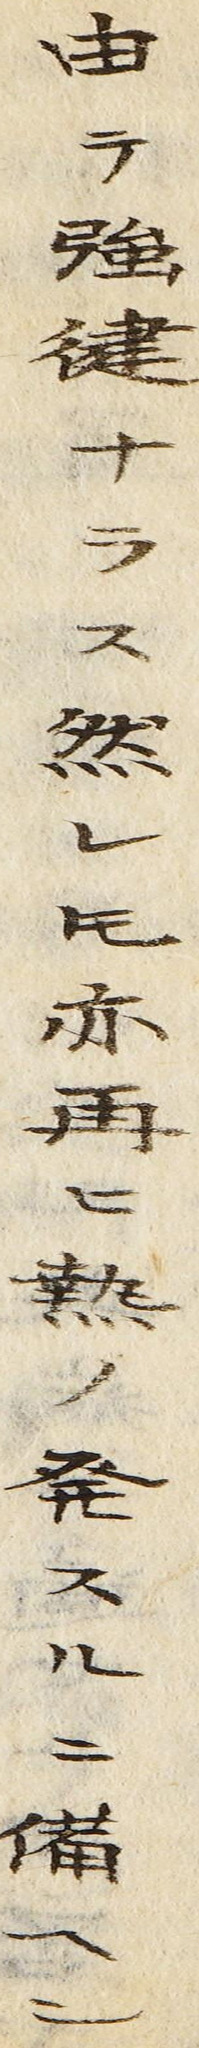由テ強健ナラス然レトモ亦再ヒ熱ノ発スルニ備ヘン
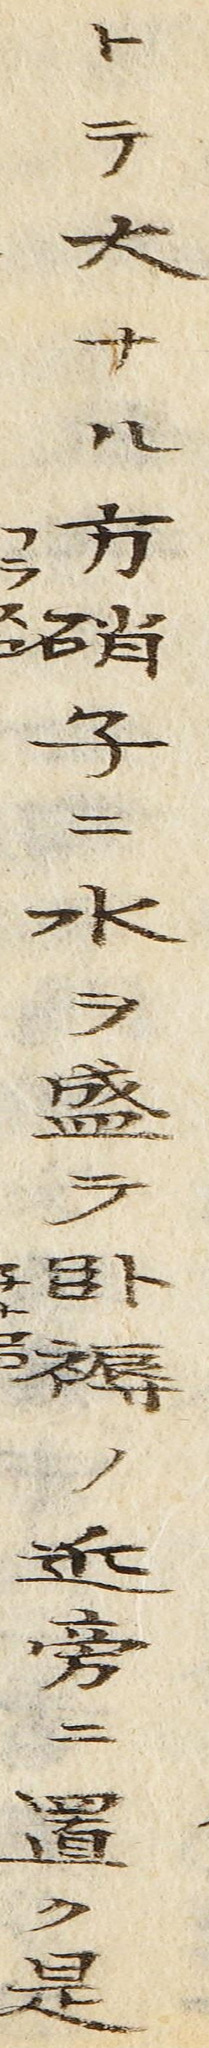トテ大ナル方硝子ニ水ヲ盛テ臥褥ノ近旁ニ置ク是
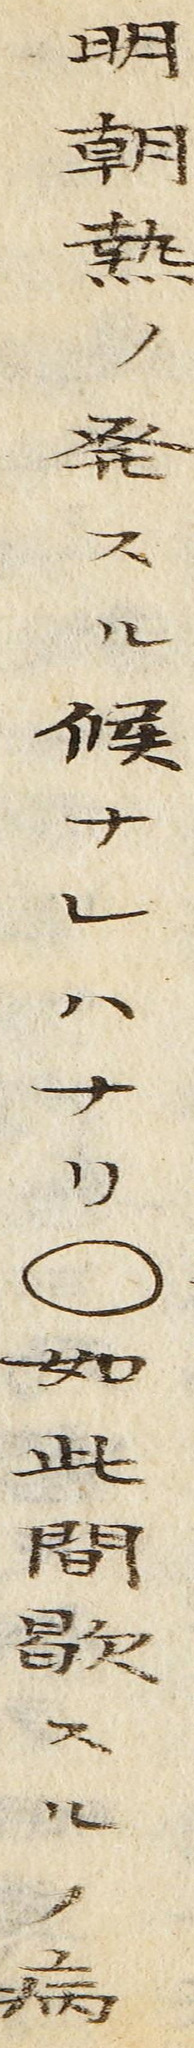明朝熱ノ発スル候ナレハナリ◯如此間歇スルノ病
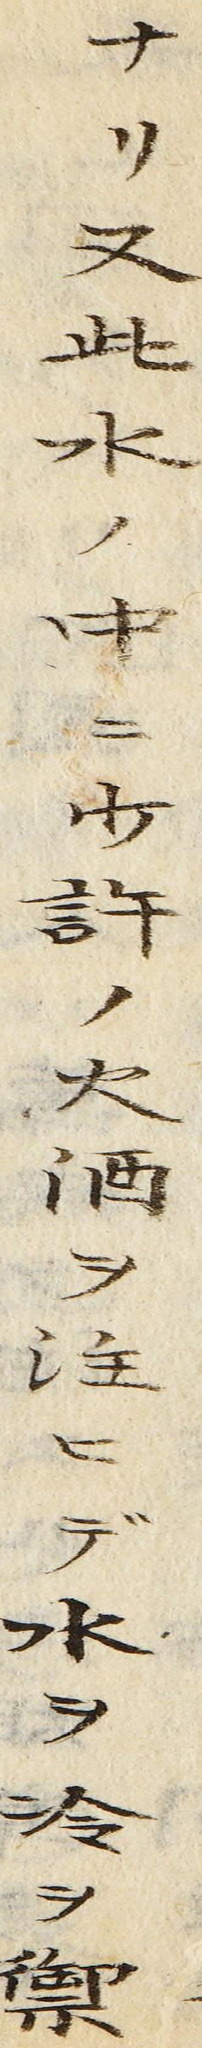ナリ又此水ノ中ニ少許ノ火酒ヲ注ヒデ水ヲ冷ヲ禦
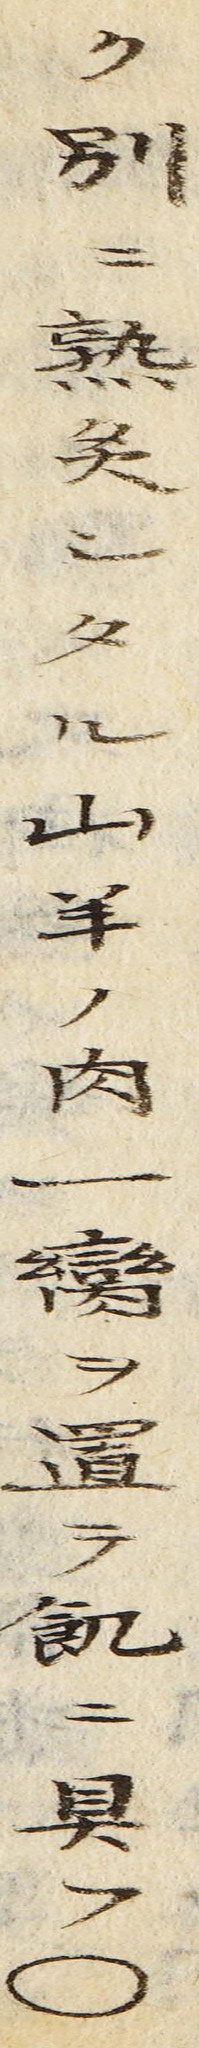ク別ニ熟炙シタル山羊ノ肉一臠ヲ置テ飢ニ具フ◯
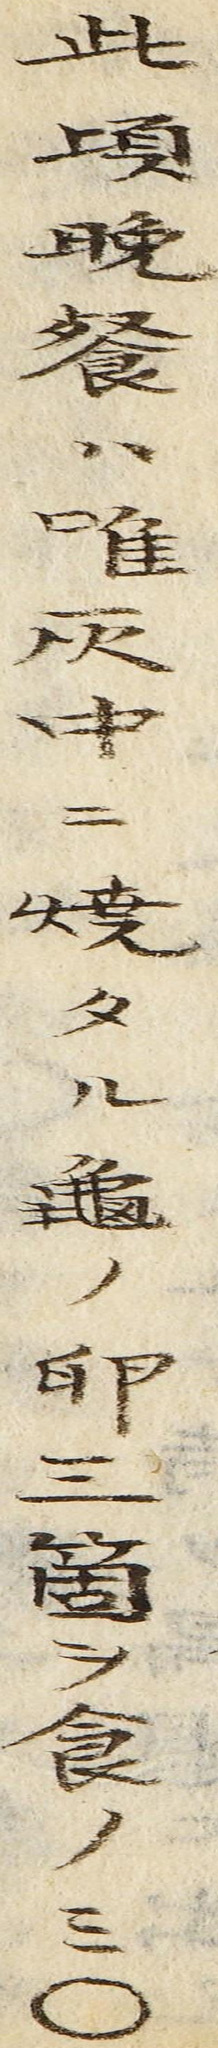此頃晩餐ハ唯灰中ニ焼タル亀ノ卵三箇ヲ食ノミ◯
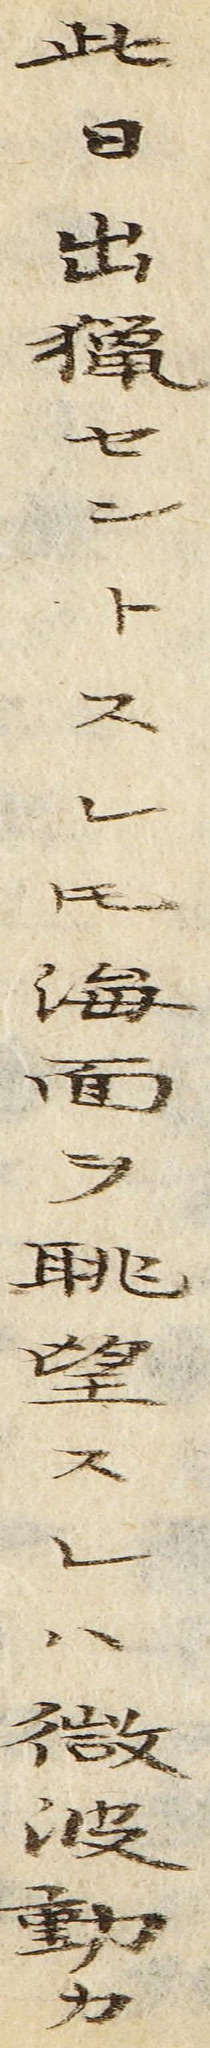此日出猟セントスレトモ海面ヲ眺望スレハ微波動カ

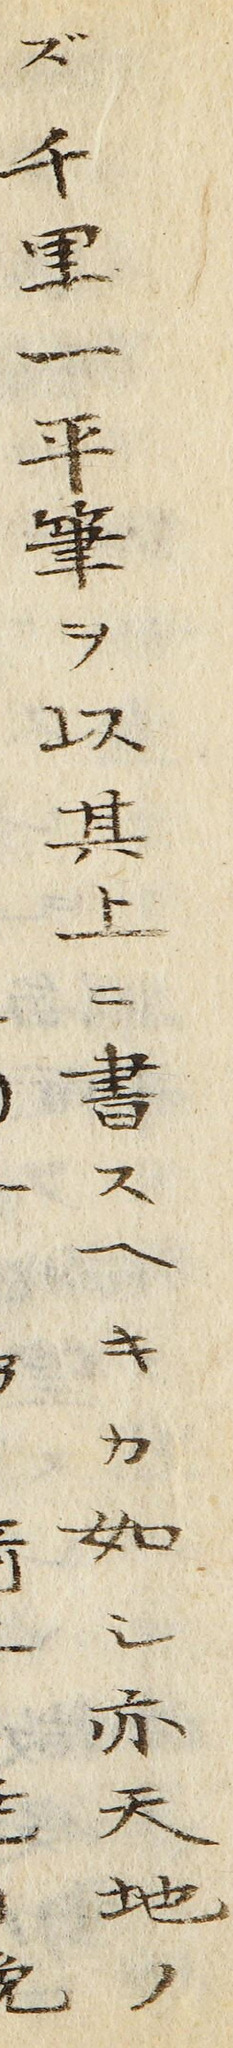ズ千里一平筆ヲ以其上ニ書スヘキカ如シ亦天地ノ
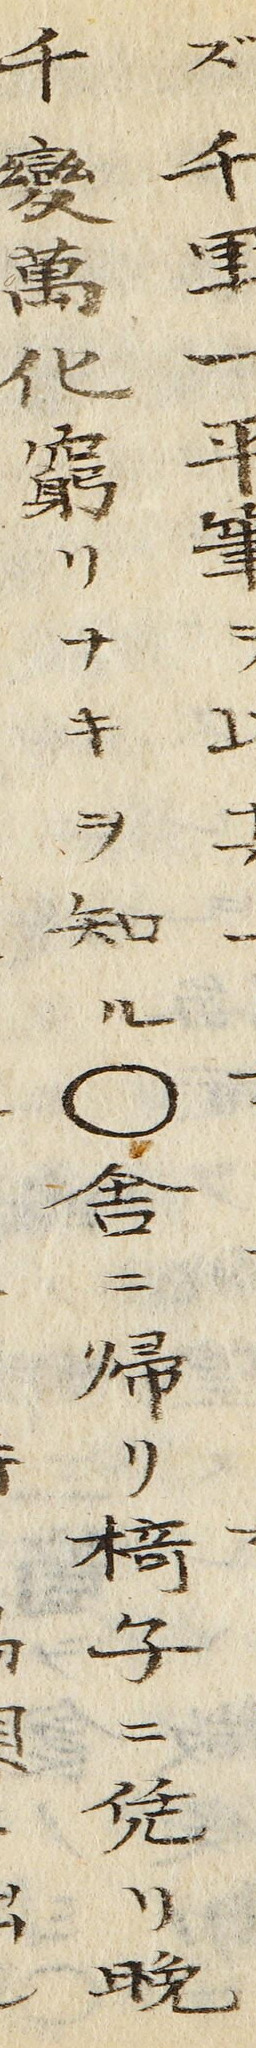千変万化窮リナキヲ知ル◯舎ニ帰リ椅子ニ凭リ晩
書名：漂流紀事
